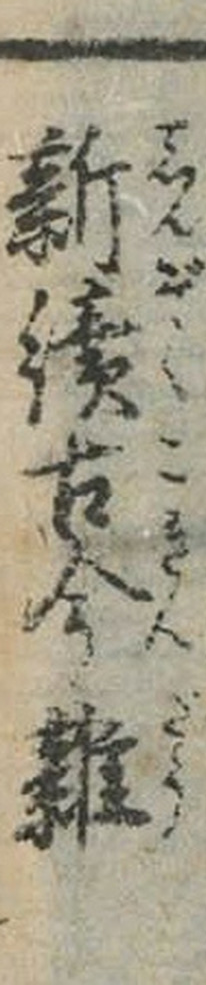新続古今雑
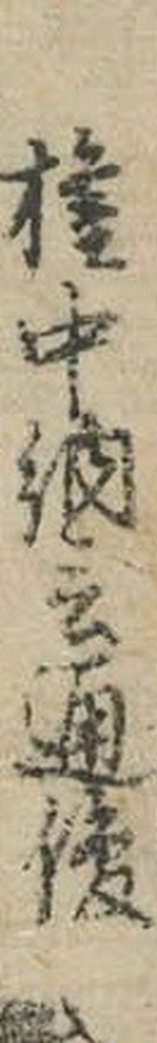権中納言通俊
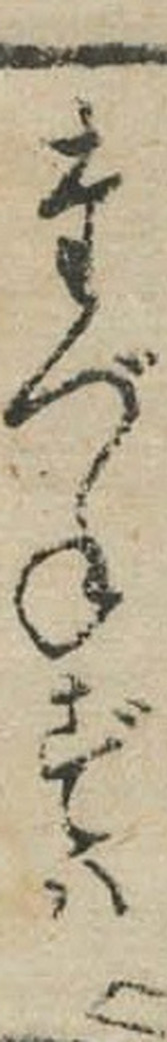たづねずは
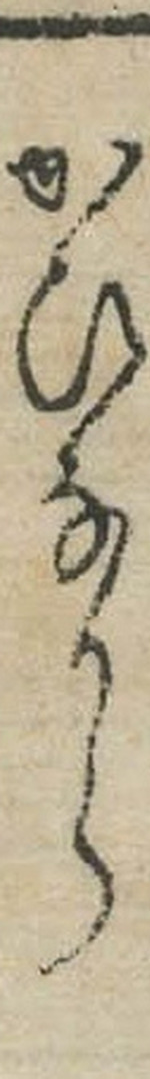かひなから
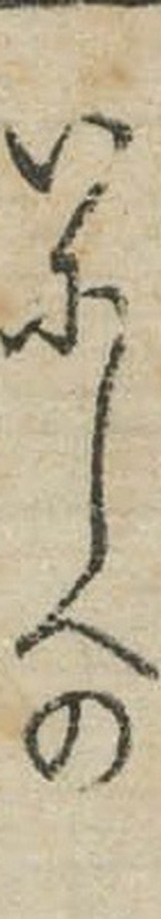いにしへの
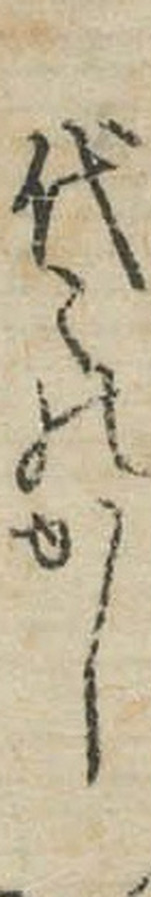代々のかし
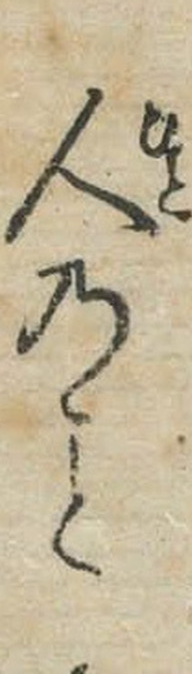人のこと
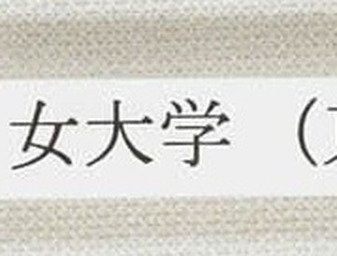女大学
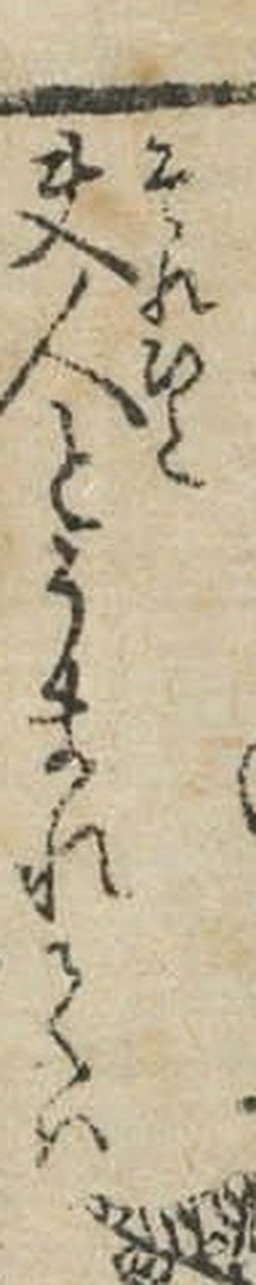夫人とうまれては
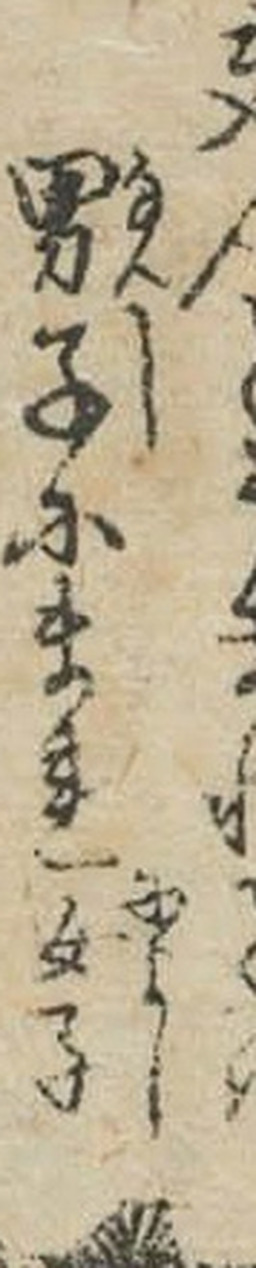男子にまれ女子
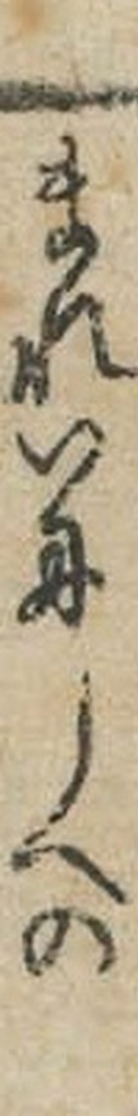まれいにしへの
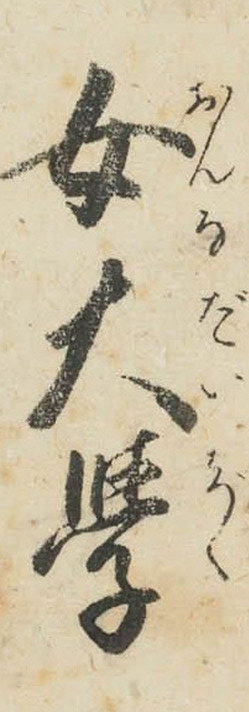女大学
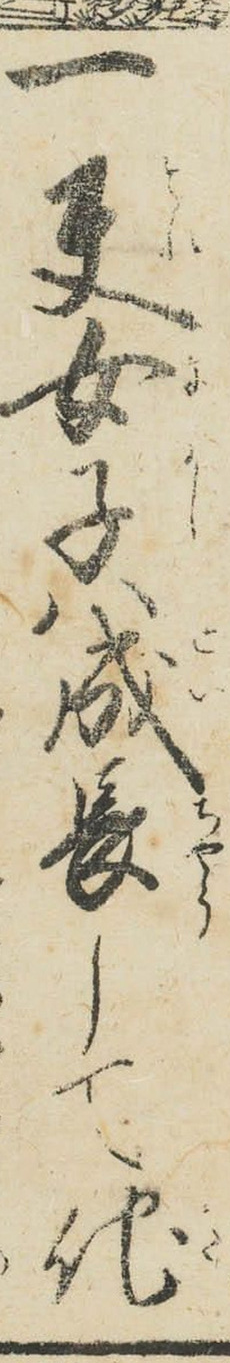一夫女子は成長して他
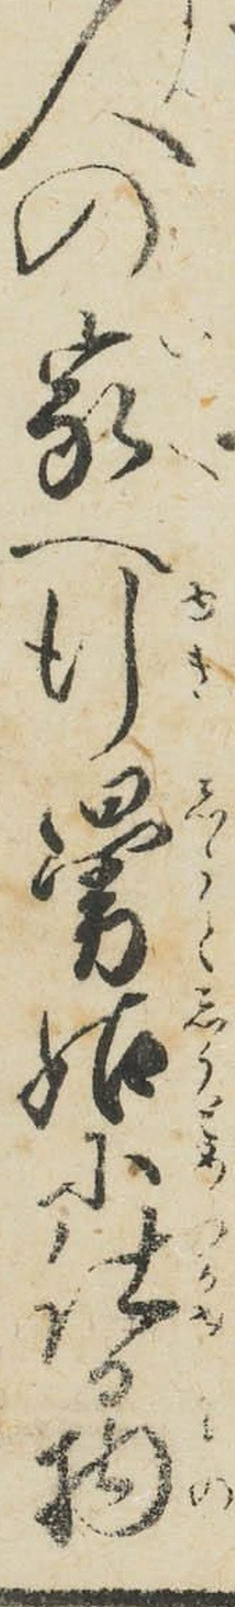人の家へ行舅姑に仕る物
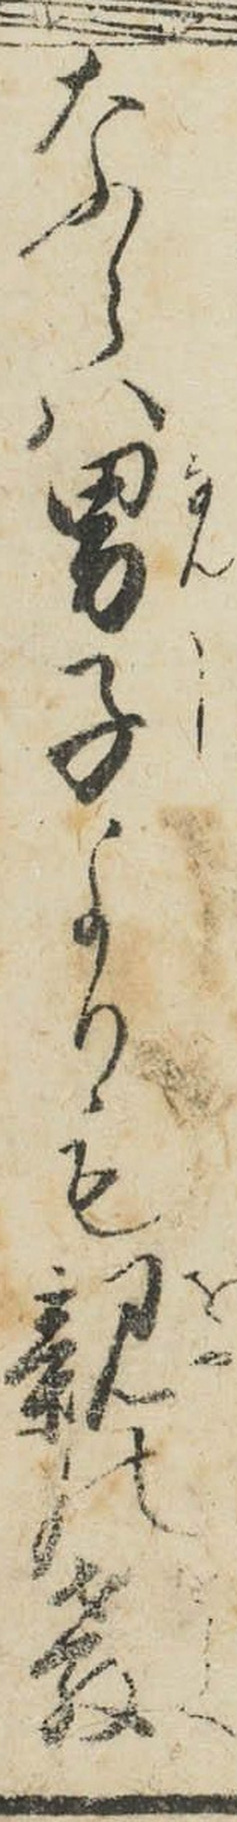ならは男子よりも親の教
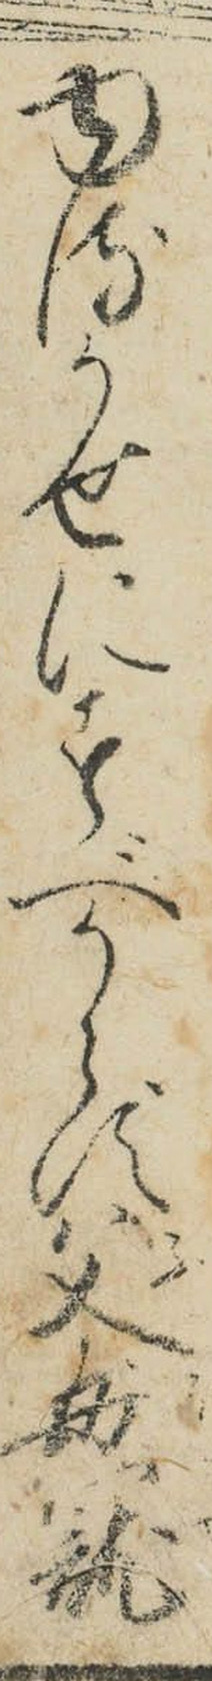ゆるかせにすべからず父母寵
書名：女大学
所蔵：東京学芸大学教育コンテンツアーカイブ
